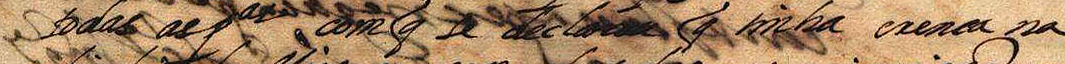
todas as pas com q̄ se declarou q̄ tinha crença na
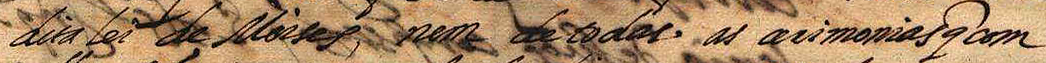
dita lei de Moises, nem de todas as cerimonias q̄ com
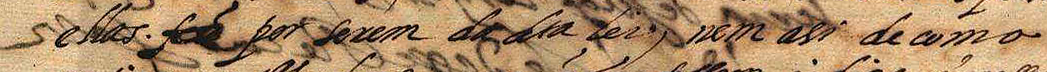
ellas fez por serem da dita lei, nem asi de como
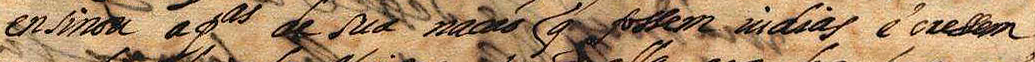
ensinou a pas de sua naçaõ q̄ fossem iudias e cressem
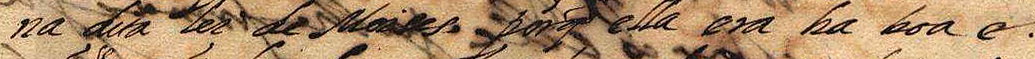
na dita lei de Moises porq̄ ella era ha boa e
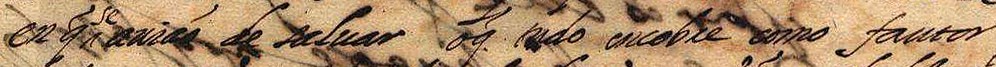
en q̄ se auiaõ de saluar o q̄ tudo encobre como fautor
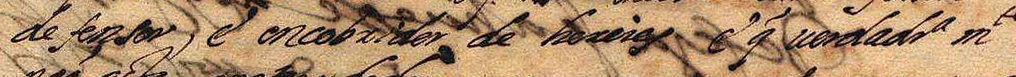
defensor, e encobridor de hereies e q̄ uerdadramte
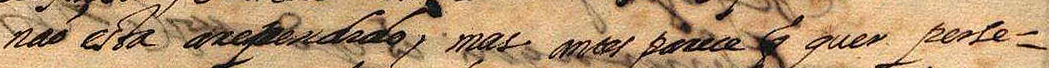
naõ esta arependido, mas antes parece q̄ quer perse
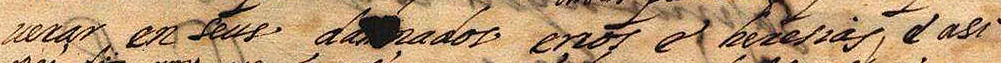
uerar en seus damnados erros e heresias, e asi
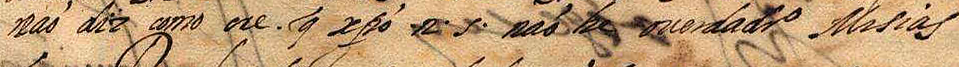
não diz como cre q̄ xpō n. s. naõ he o uerdadro Mesias
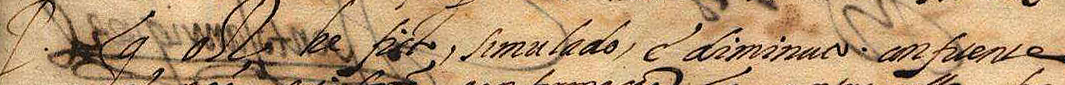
P. q̄ o R he ficto, simulado, e diminuto confitente
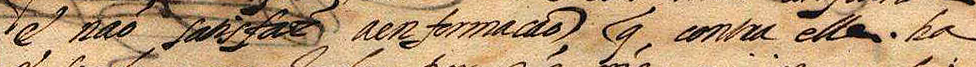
e naõ satisfaz a enformação q̄ contra elle ha
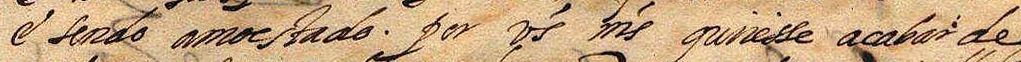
e sendo amoestado por vs̄ ms̄ quizesse acabar de
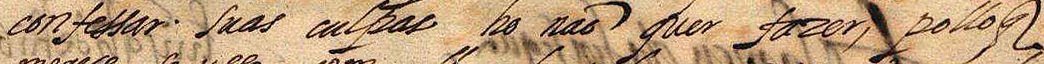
confessar suas culpas ho naõ quer fazer, pollo q̄
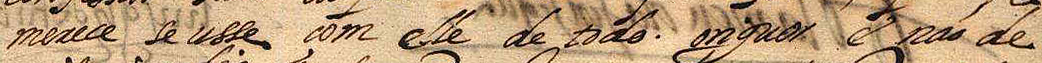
merece se usse com elle de todo o riguor e não de
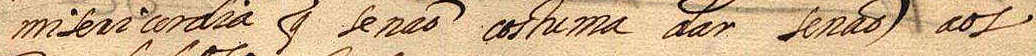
misericordia q̄ se não costuma dar senaõ aos
